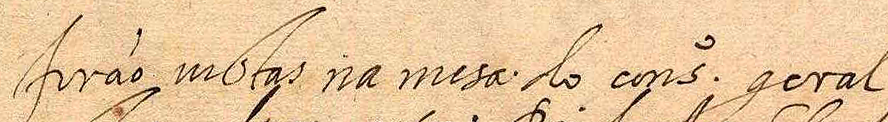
foraõ uistas na mesa do cons.o geral
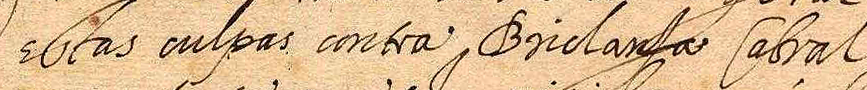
Estas culpas contra Briolanja Cabral
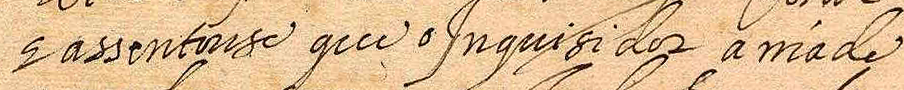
E assentouse que o Jnquisidor a māde
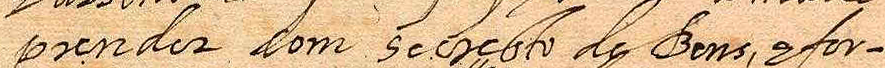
prender com secresto de Bens, E for
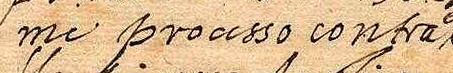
me processo contra
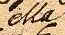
ella
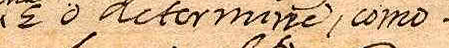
E o determine, como
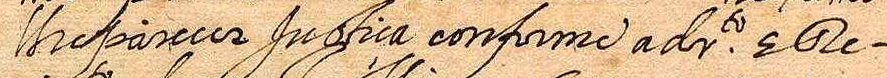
lhe parecer Justiça conforme a drto. E Re
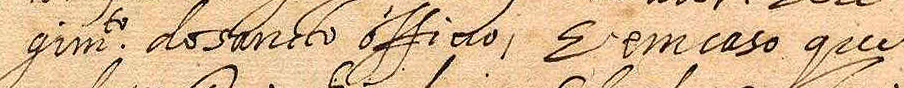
gim.to do sancto officio, E em caso que
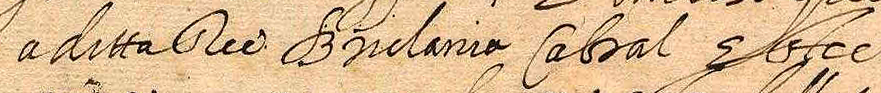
a ditta Ree Briolania Cabral Esta
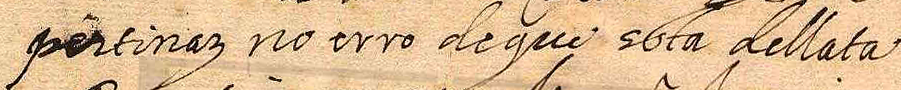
pertinaz no erro de que Esta dellata
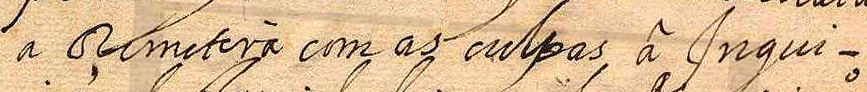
a Remetera com as culpas á Jnqui
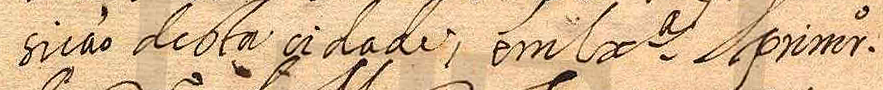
sição desta cidade, em lx.a primr.o
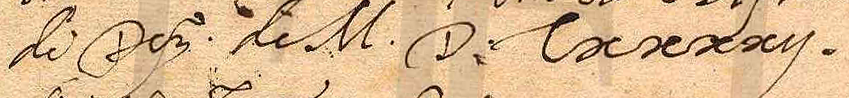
do Dez.o de M. D. lxxxxij.
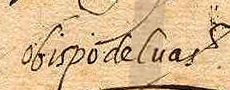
o bispo deluas
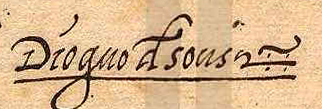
Dioguo d̄ sousa
